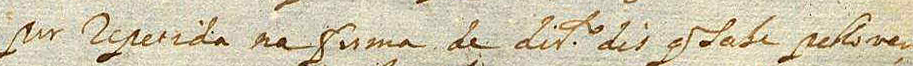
per repetida na forma de dir.to dis q̄ sabe pello ver,
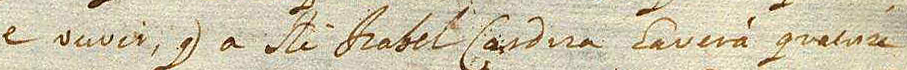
e ouvir, q̄ a Ré Izabel Cardoza haverá quatorze
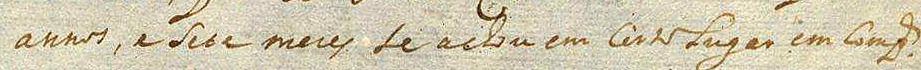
annos, e sete mezes se achou em certo Lugar em comp.a
